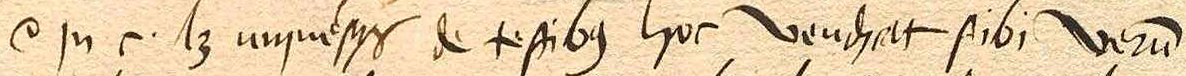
e jn c. lꝫ unjuēsys de testibꝯ hoc vendjcat sibi verū
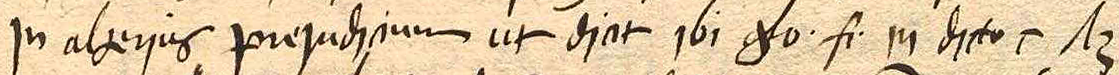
jn alterjus prejudicium ut dicit jbi glo. fi. jn djcto c lꝫ
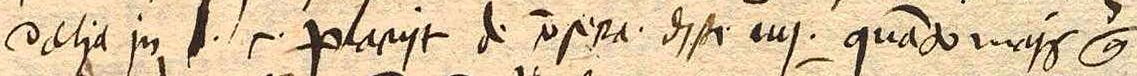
e alja jn _. c. placujt de c̄osecra. djsti. iiij. quāto majs q̄
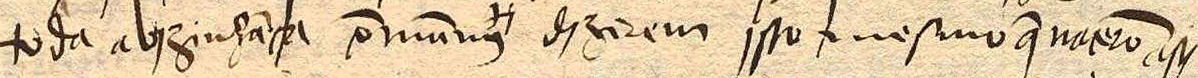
toda a vjzinhāça c̄omūmti djzerem jsso mesmo q̄ naçēro asy
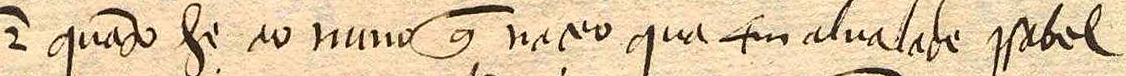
item quāto he ao nuno q̄ naçeo qua Em alualade jsabel
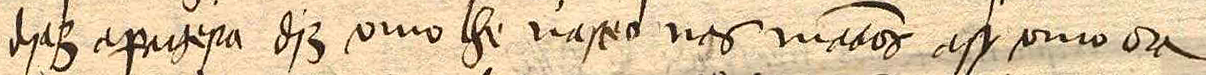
djaz a partejra djz como lhe naceo nas mãaos asy como ora
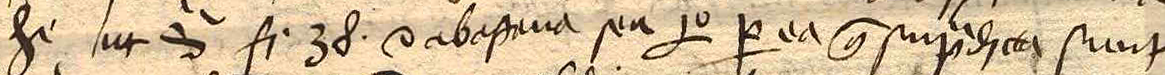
he ut S̄ fi. 38. e abastaua seu to ꝑ ea q̄ sup̄djcta sunt
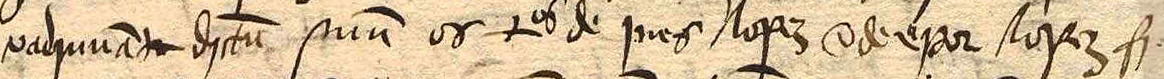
coadjuuāt djc̄tu suū os tos de jnes lopez e de ejtor lopez fj
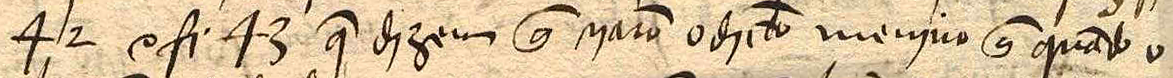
42 e fi. 43 q̄ djzem q̄ crjarō o djc̄to menjno q̄ quādo o
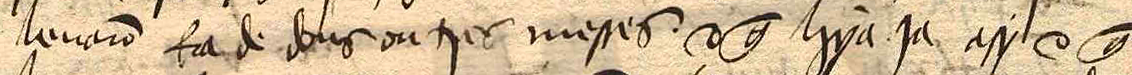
leuar̄o Era de dous ou tres messes. e q̄ hya Ja asy e q̄
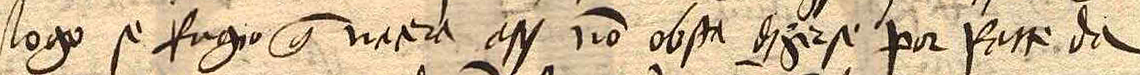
logo se fugio q̄ nacera asy nō obsta djzerse por parte da
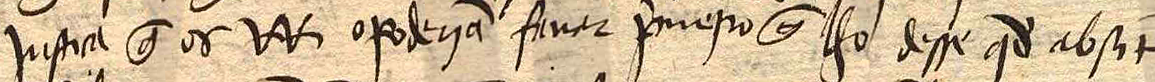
Justiça q̄ os RR o poderjā fanar p̄mejro q̄ lho desse qd' absit
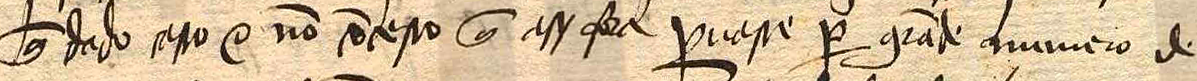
q̄ dado casso e nō c̄ocesso q̄ asy fora ꝓuasse ꝑ grāde numero de
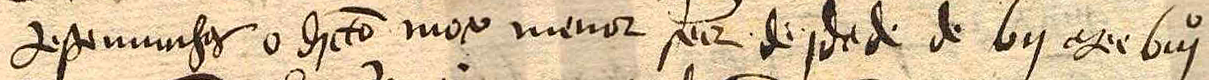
testemunhas o djc̄to moço menor seer de jdade de bij atee biijo
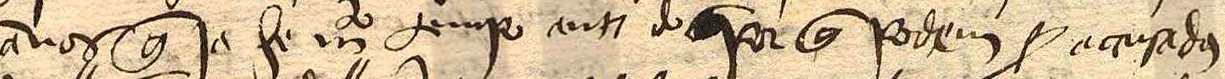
ānos q̄ Ja he mto tempo anti do por q̄ podem ꞩ accusadꝯ
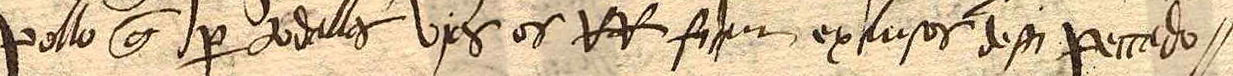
pollo q̄ ꝑ todallas vjas os RR ficam excusos desti peccado //
